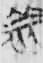羕
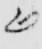㠯（以）
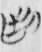○（廷）
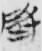阩
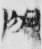門
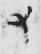又
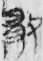敗
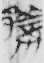{邑義}（義）
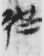○（強）
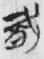戠
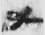之
